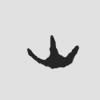山
